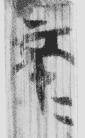不=
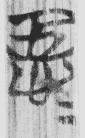忠=
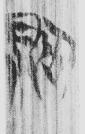則
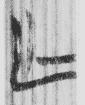亡
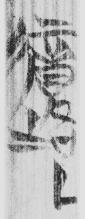復
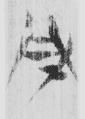凡
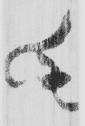氒
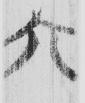六
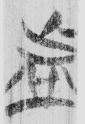者
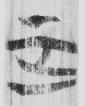正
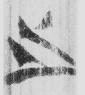之
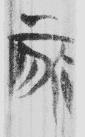所
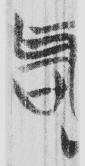{㠯ㅋ}
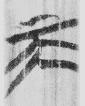天
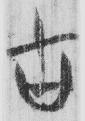古
